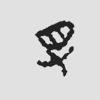𠭁
